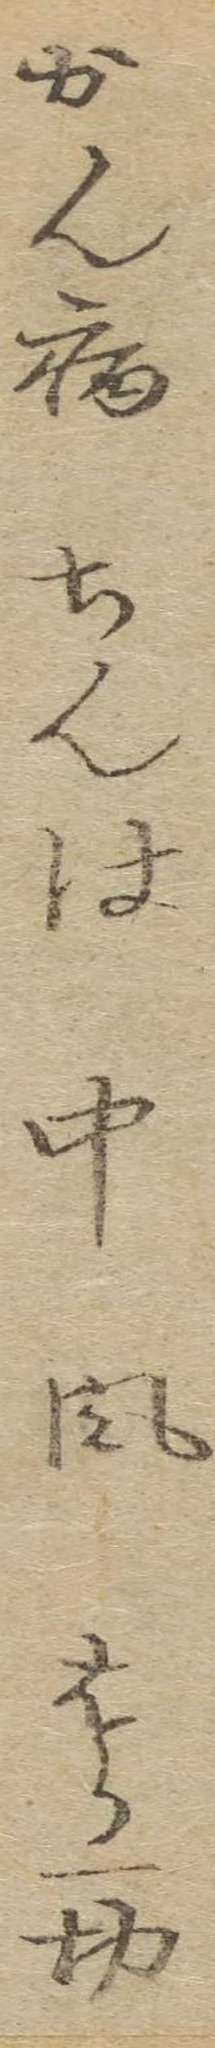かん病ちんは中風はら一切
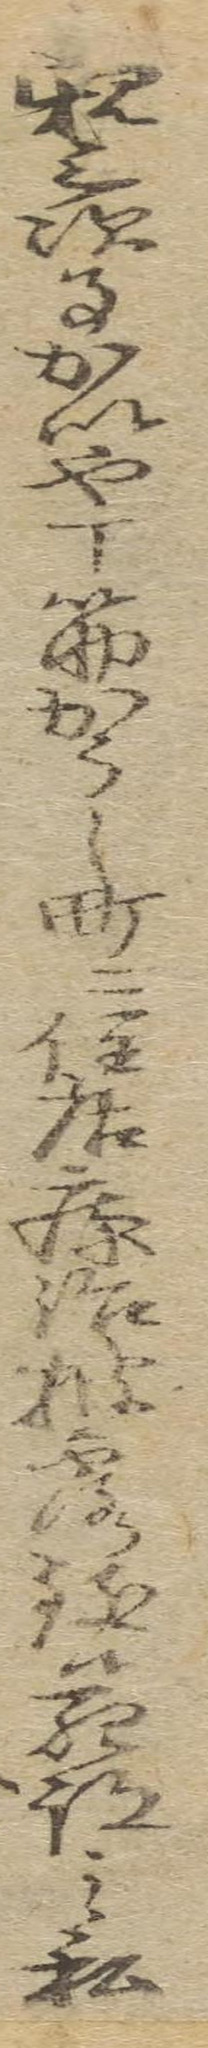親三次事かいや丁筋からし町に住居療治披露致候罷跡之私
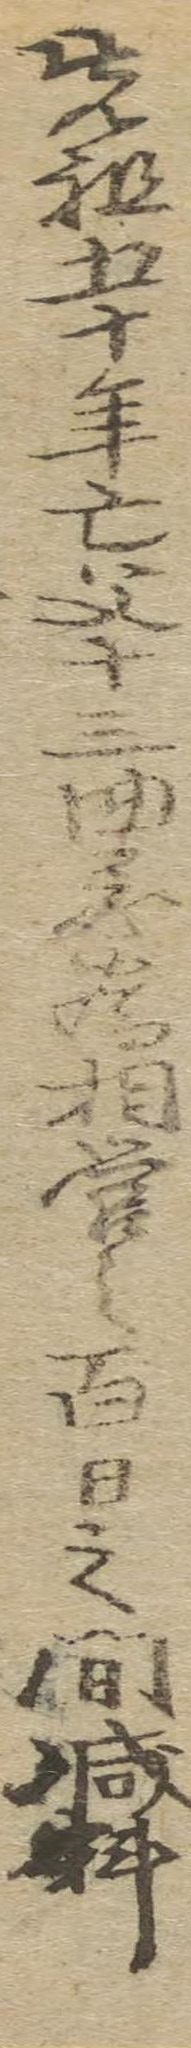先祖五十年亡父十三回忌為相営之百日之間減料
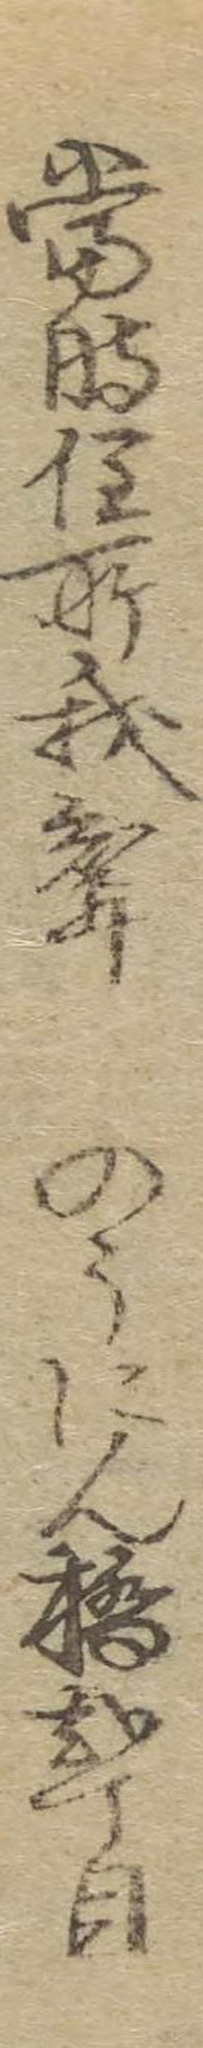当時住所我聟のうにん橋弐丁目
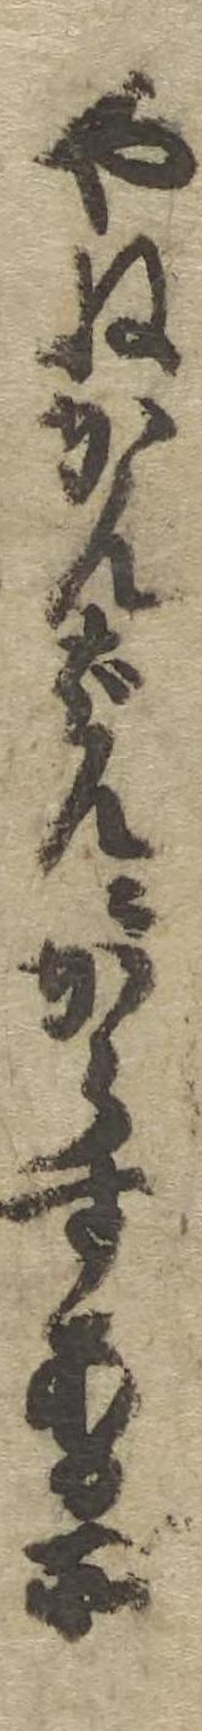やねかんばんにからすある所
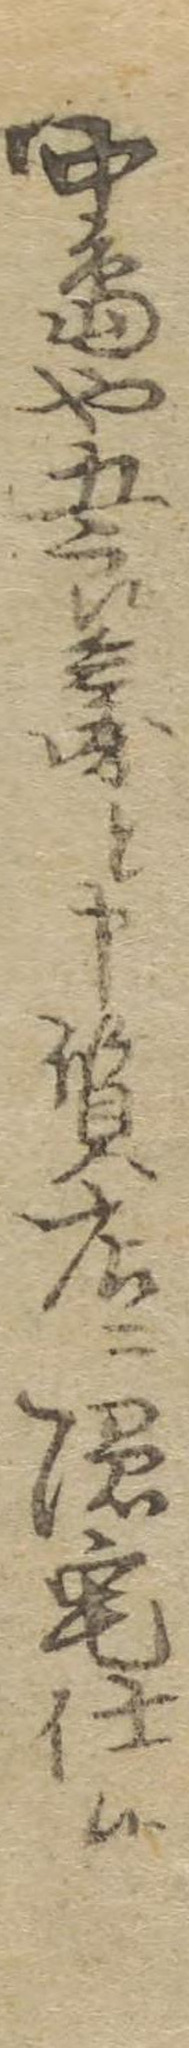中島や五郎兵衛と申質店に隠宅仕候
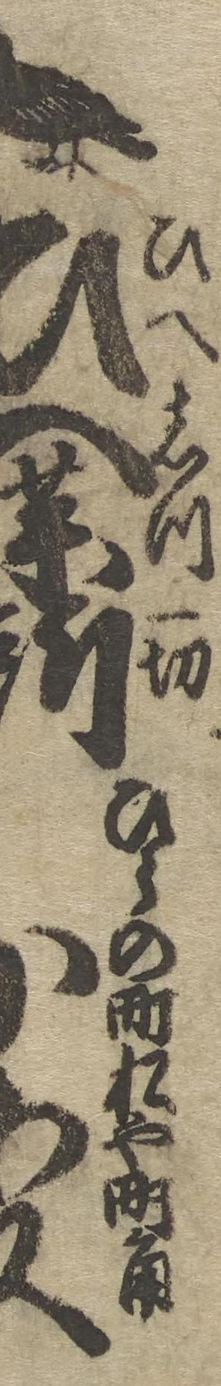ひへしつ一切ひらの町松や町角
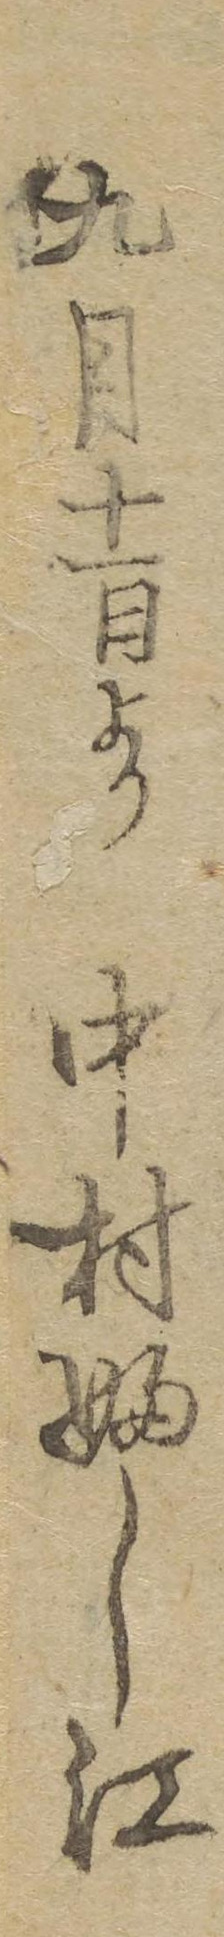九月十一日より中村ふし江
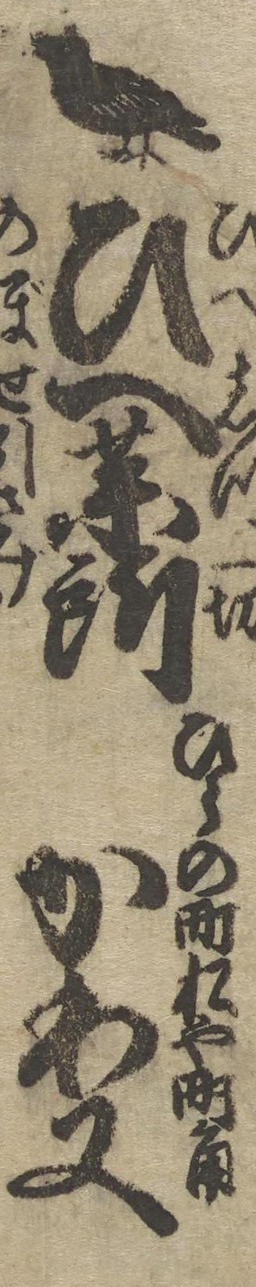ひへ薬所かわ又
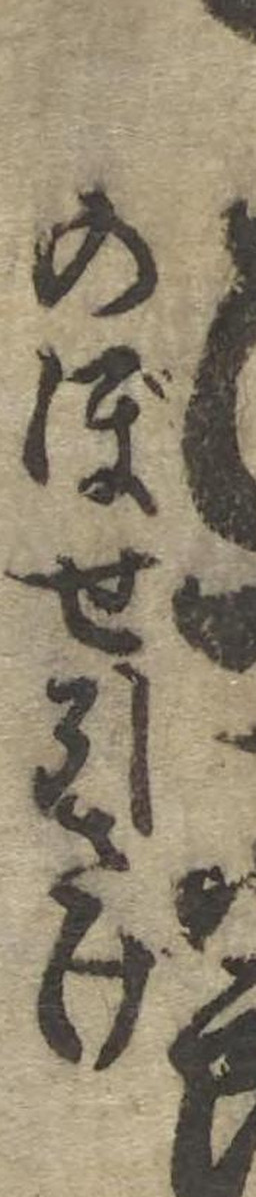のぼせ引さけ
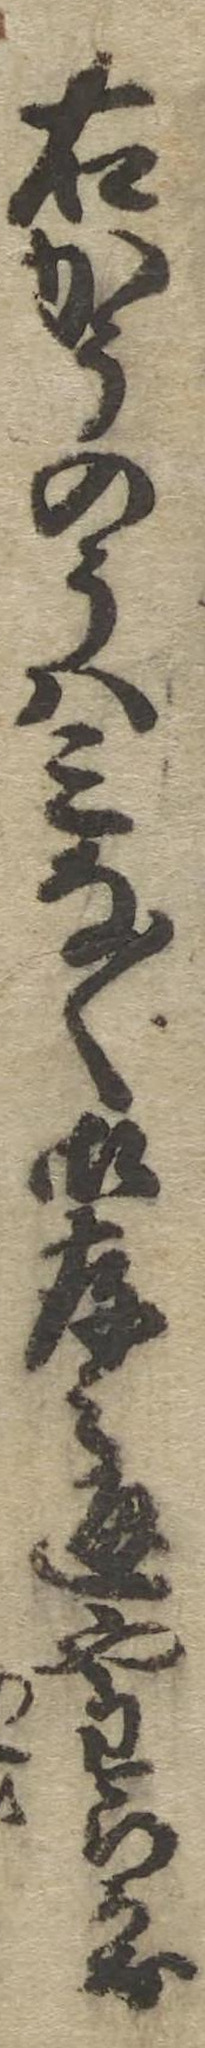右かうのうはみな〳〵御存之通やわらかな
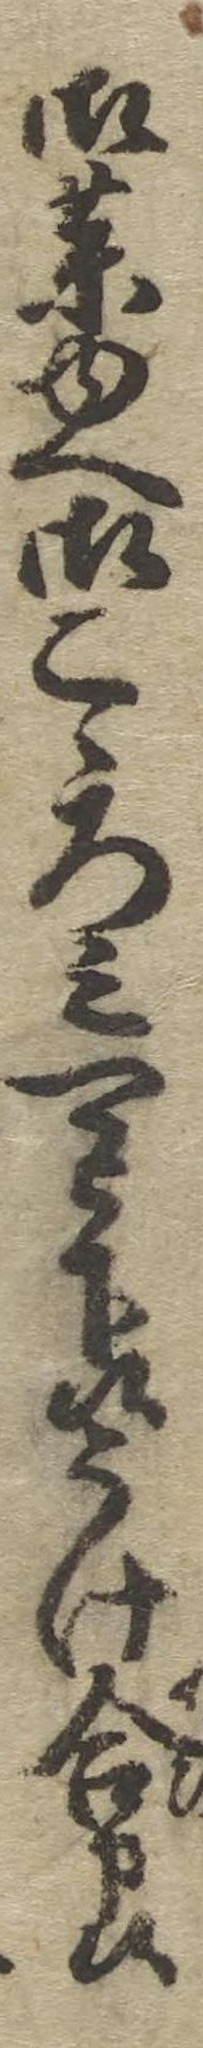御薬ゆへ御こゝろみ可被下候うけ合申候
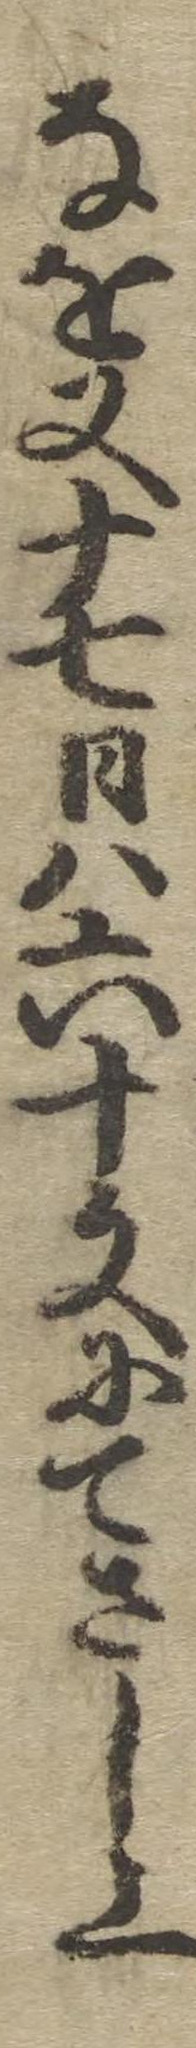なを又十七日は六十文にてさし上
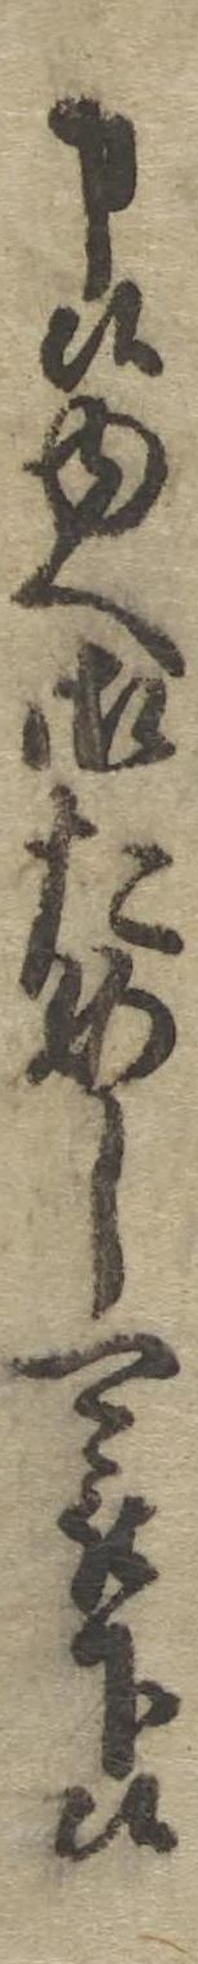申候ゆへ御ためし可被下候
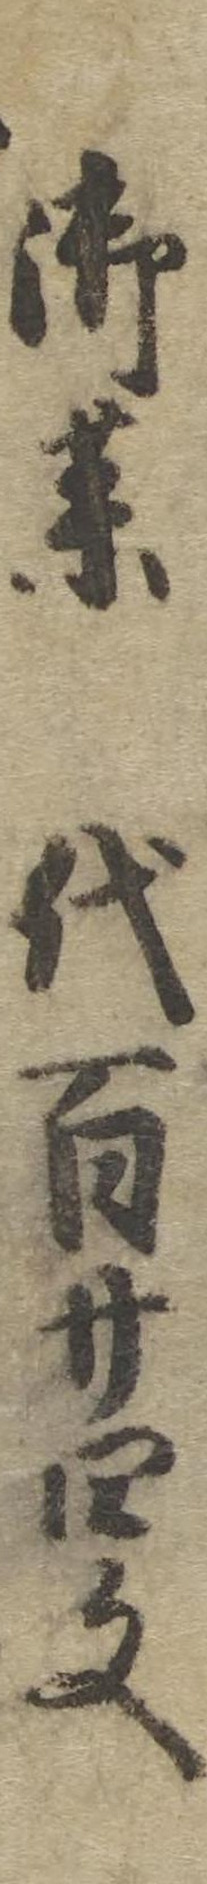御薬代百廿四文
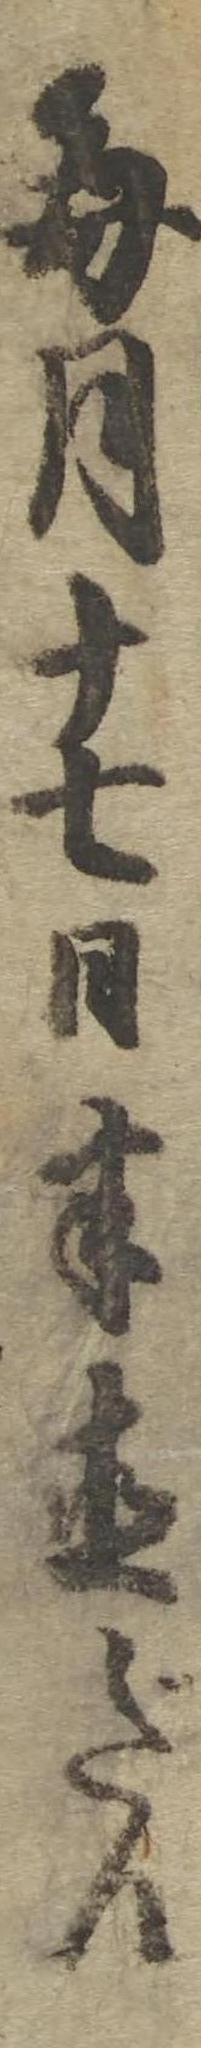毎月十七日半直だん
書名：浪華薬種問屋能書張交帖. 二
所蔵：国立国会図書館 National Diet Library, JAPAN
